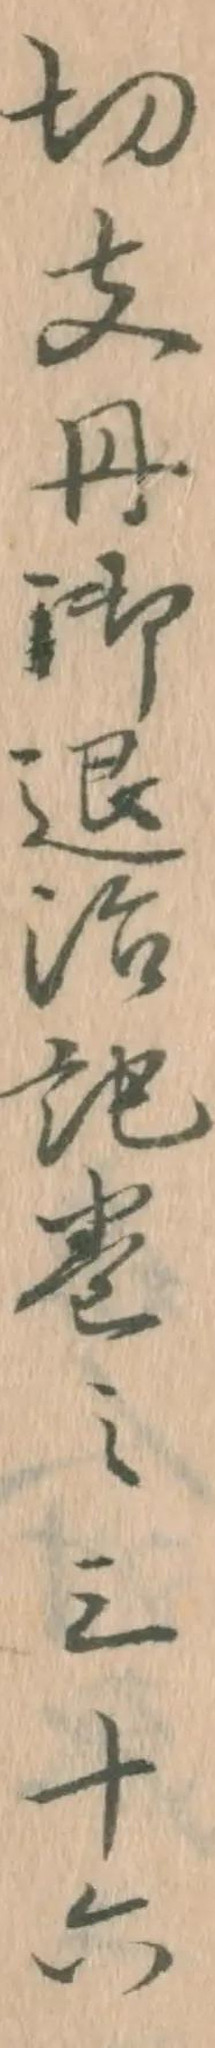切支丹御退治記巻之三十六
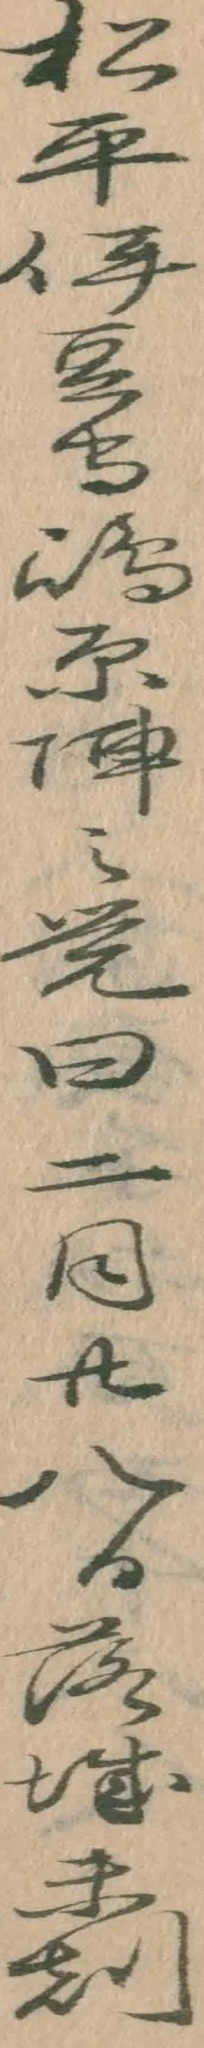松平伊豆守島原陣之覚曰二月廿八日落城未刻
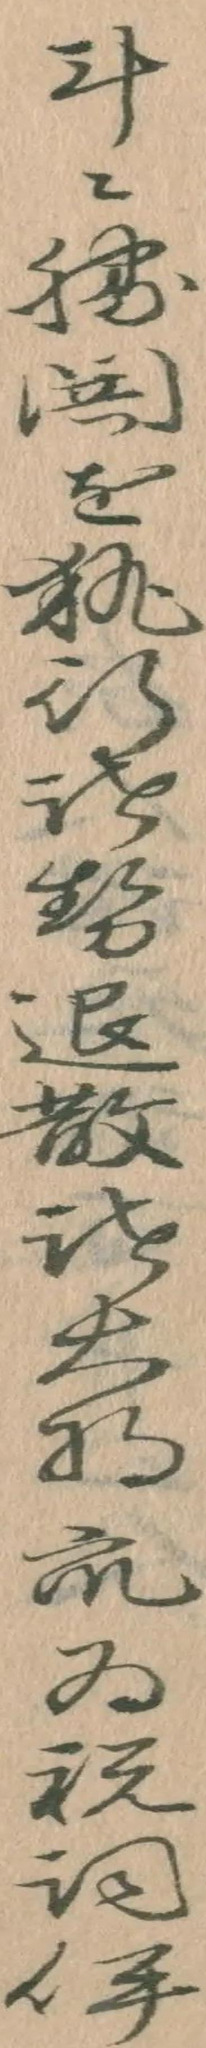斗に勝鬨を執行諸勢退散諸大将衆ゐ祝詞伊
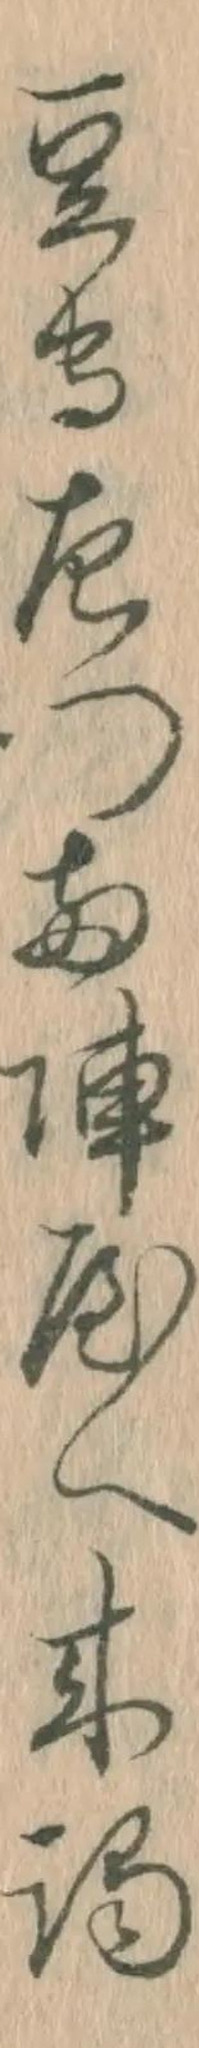豆守左門両陣屋へ来謁
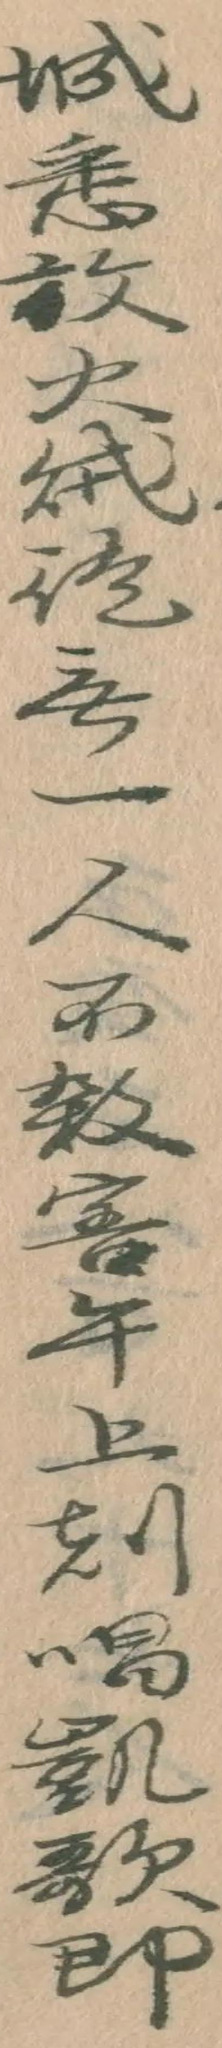城悉放火賊徒無一人不殺害午上刻唱凱歌即
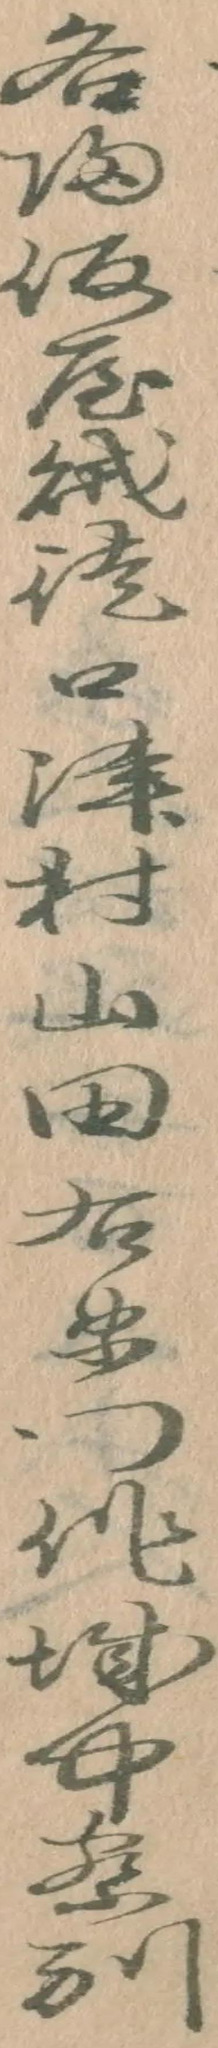各帰仮屋賊徒口津村山田右衛門作城中察別
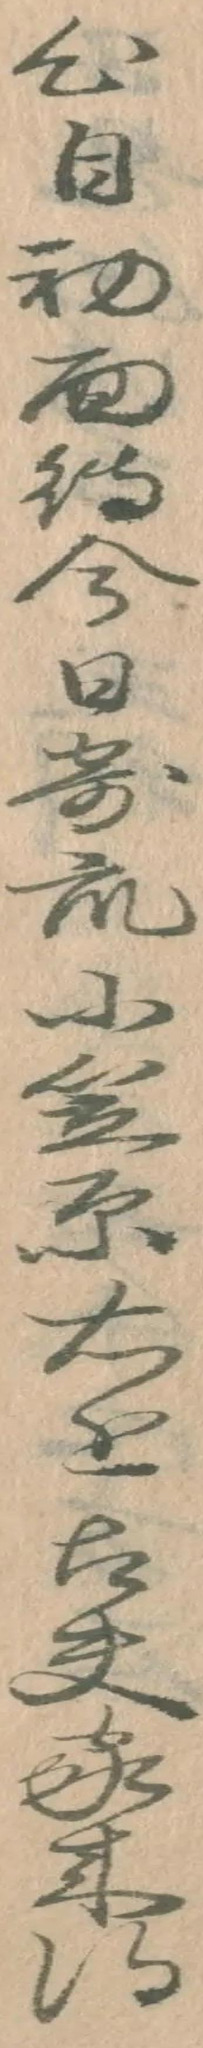心自初面待今日寄衆小笠原右近太夫家来得
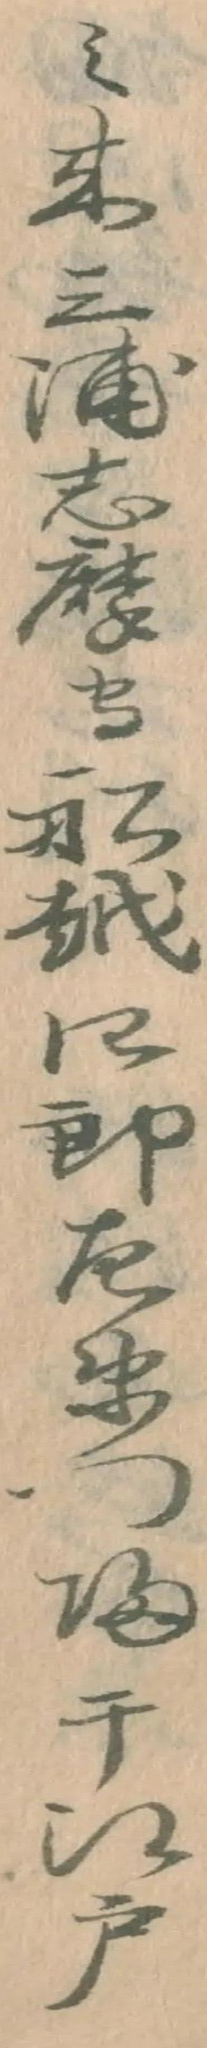之来三浦志摩守舩越四郎左衛門帰干江戸

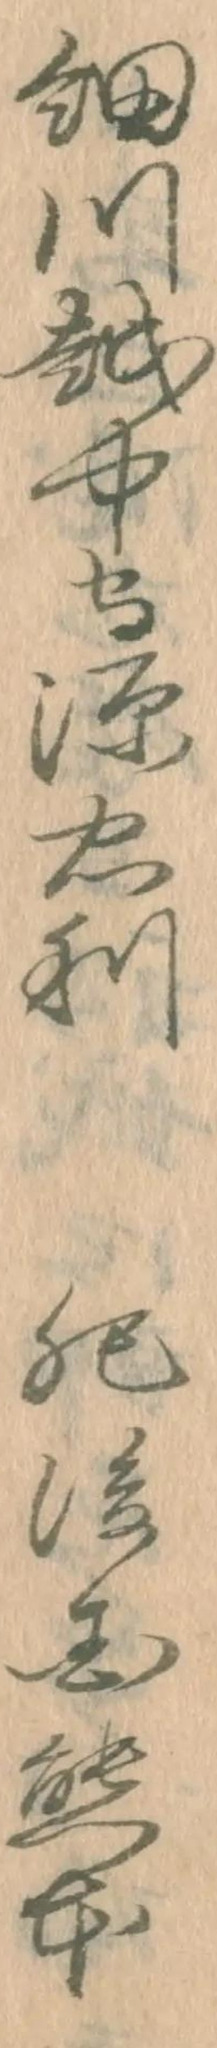細川越中守源忠利肥後国熊本
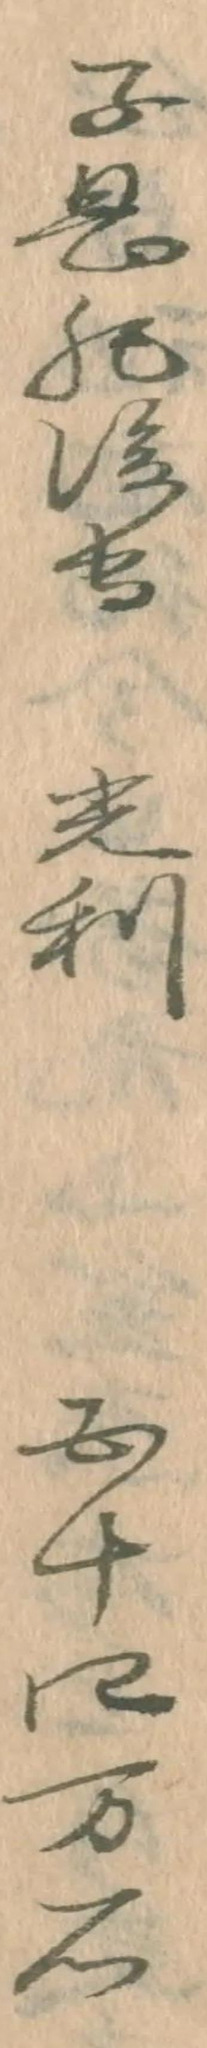子息肥後守光利五十四万石
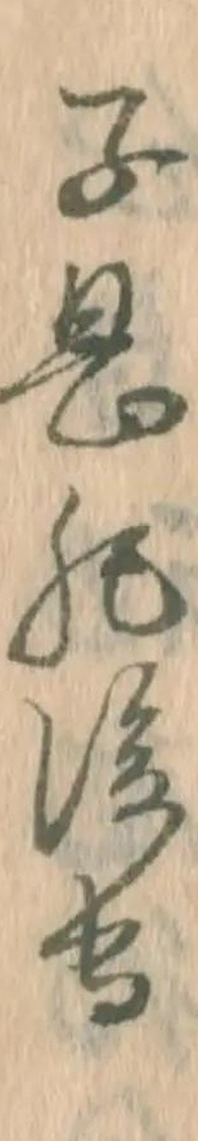子息紀伊守
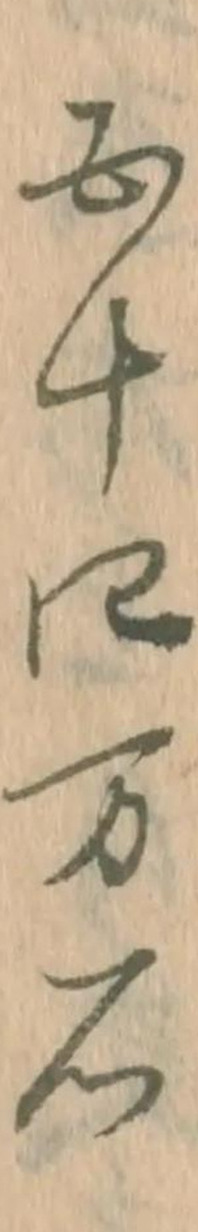五十二万三
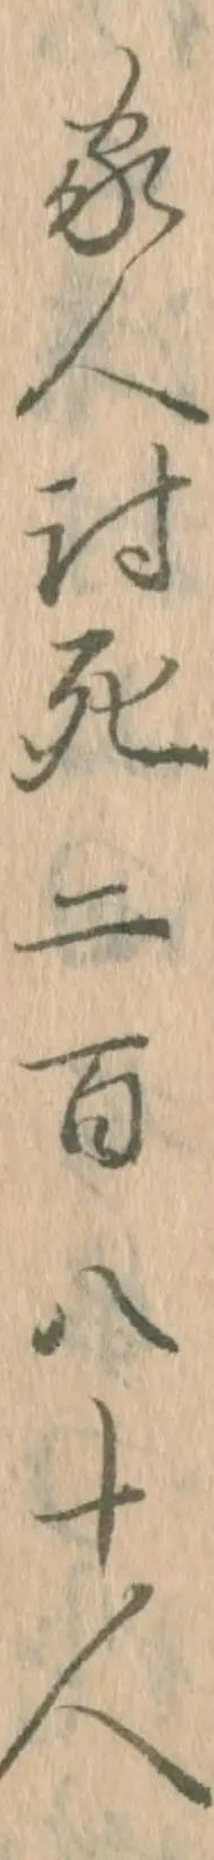家人討死二百八十人
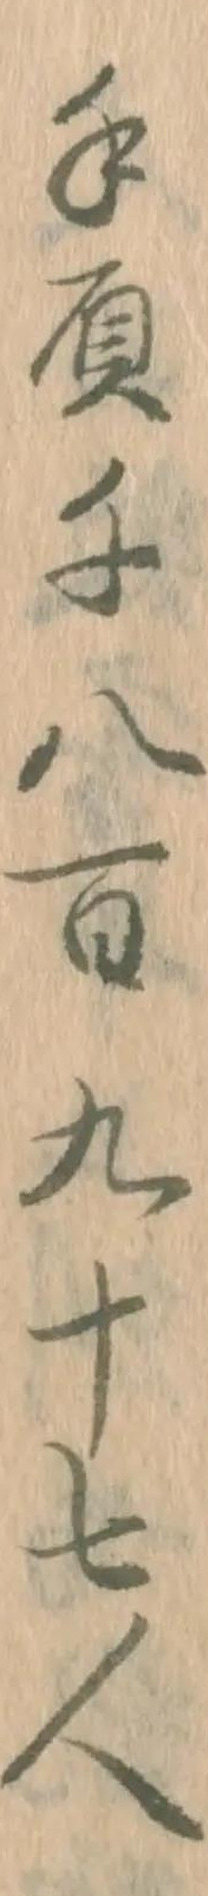手負千八百九十七人
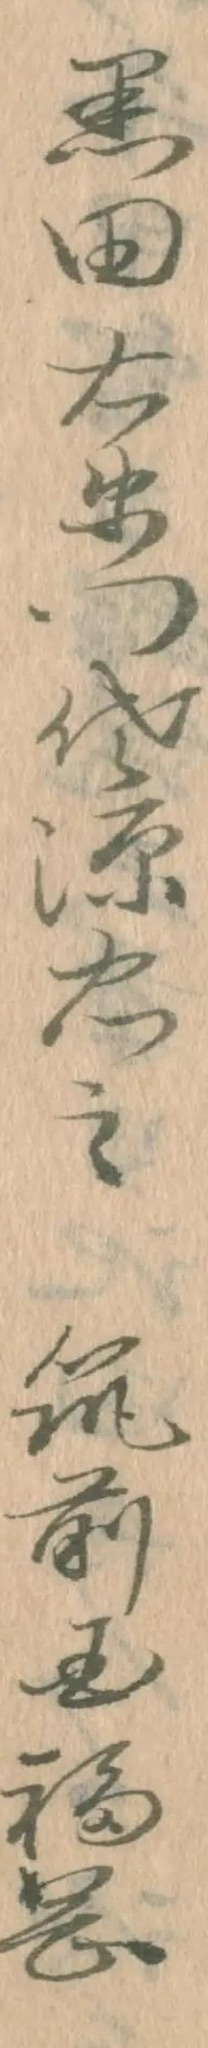黒田う右衛門佐源忠之筑前国福岡
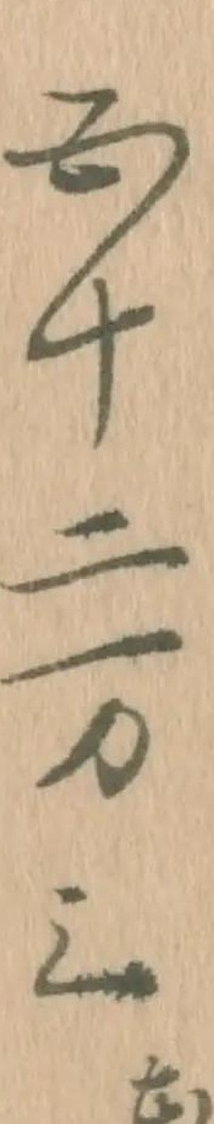五十二万三
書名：切支丹御退治記 49巻. [9]
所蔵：国立国会図書館 National Diet Library, JAPAN
